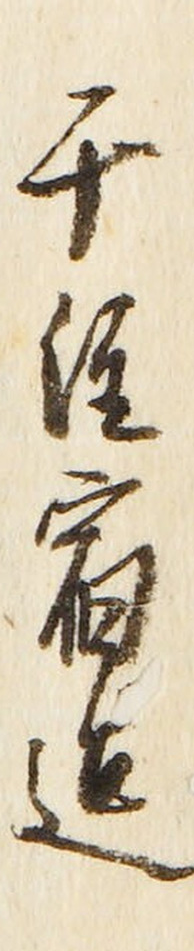千住宿迄
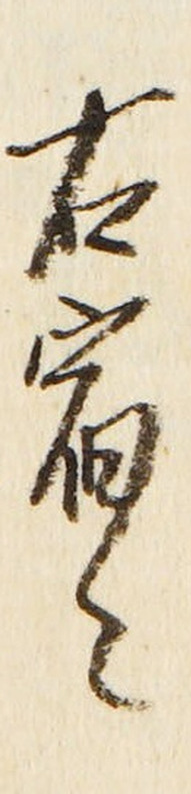右宿々

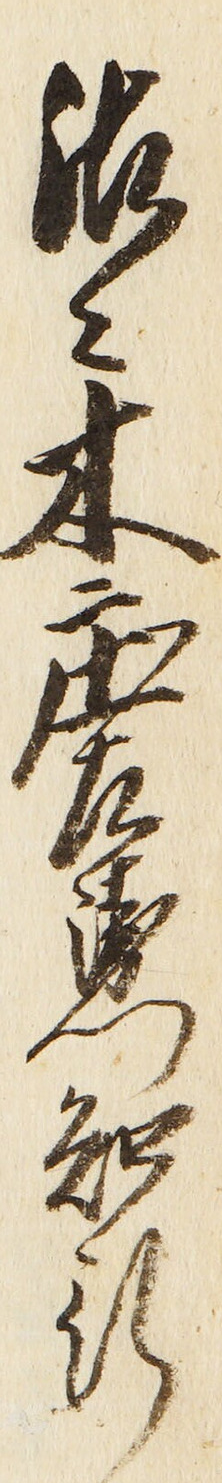佐々木庄左衛門知行
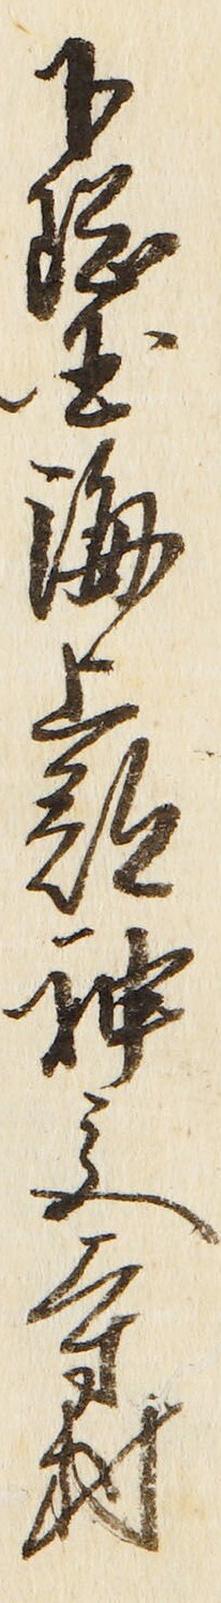下総国海上郡神宮寺村
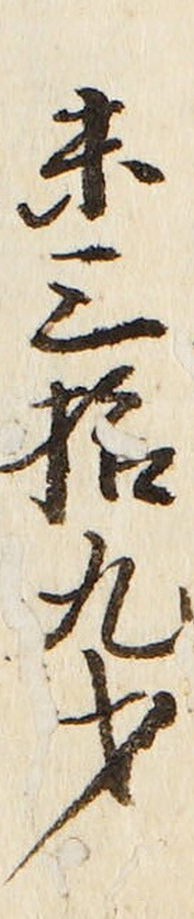未三拾九才
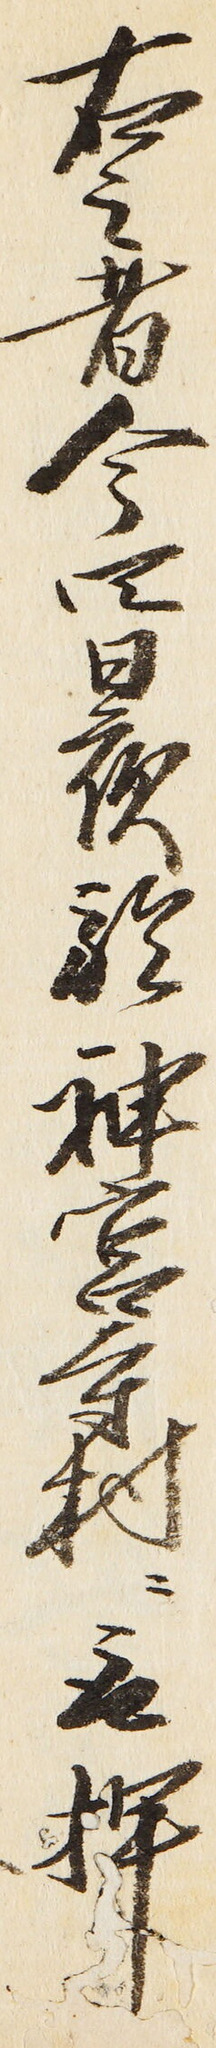右之者今四日夜於神宮寺村ニ取押
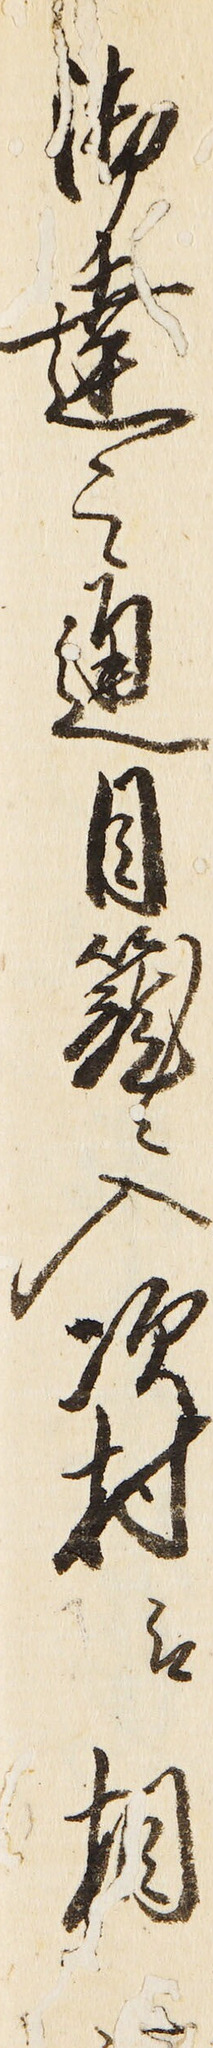御達之通目籠ニ入次村江相
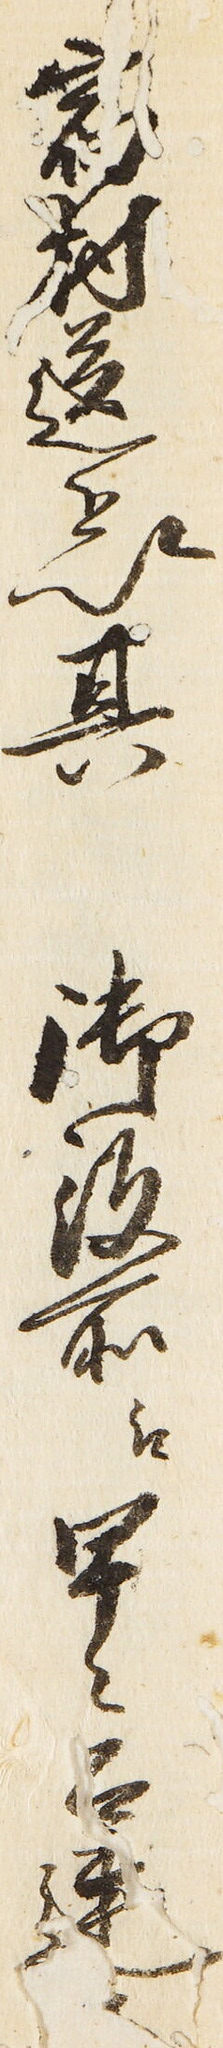宿村送を以其御役所江早々召連
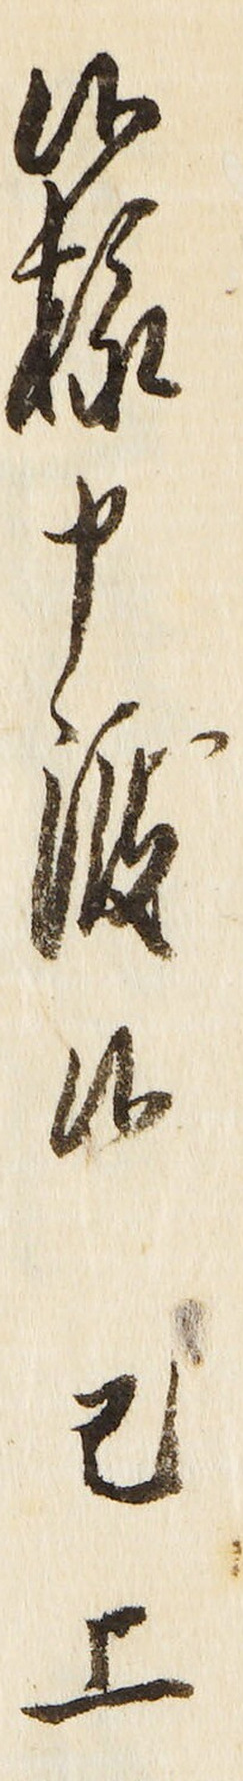候様申渡候已上
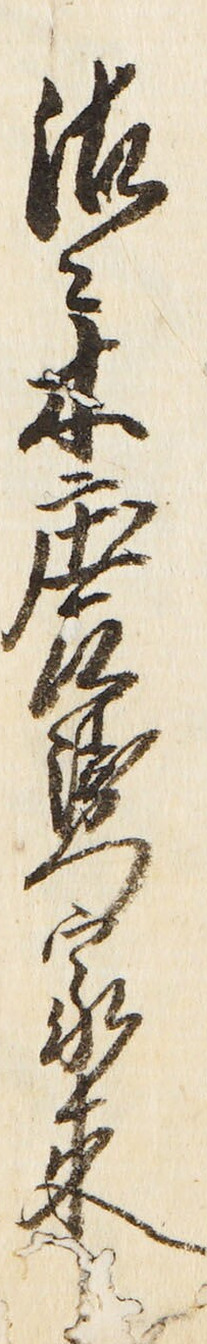佐々木庄左衛門知行
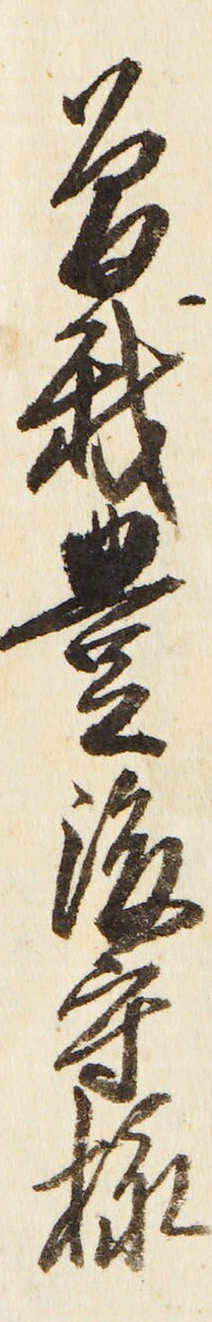曾我豊後守様
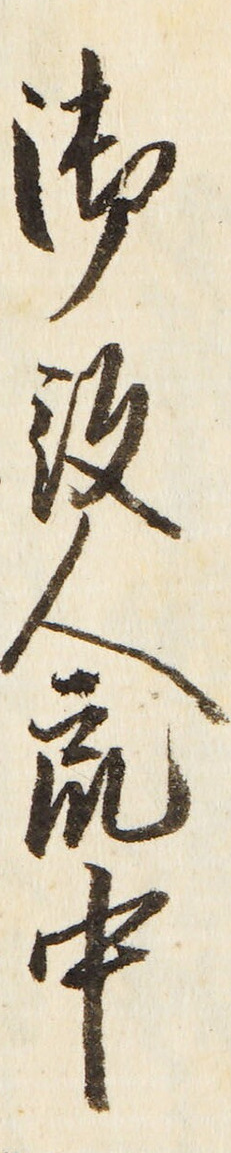御役人衆中

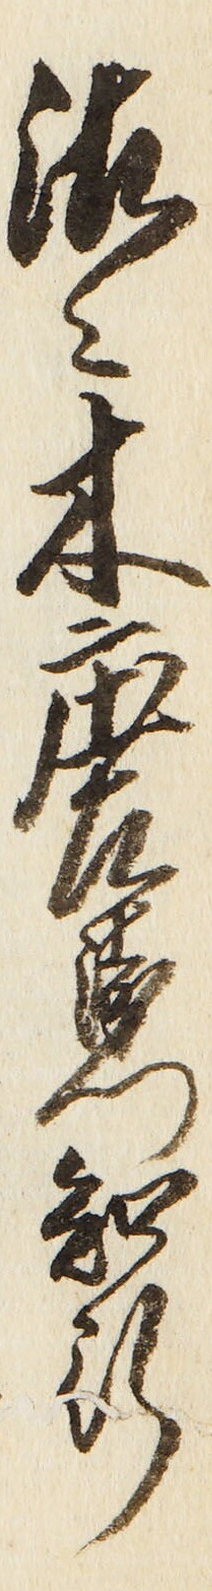佐々木庄左衛門知行
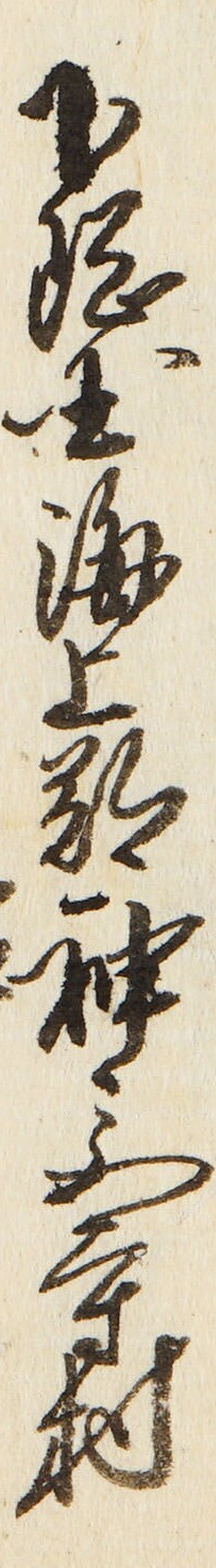下総国海上郡神宮寺村
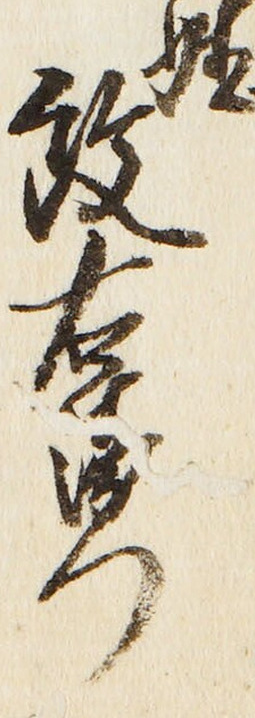政右衛門
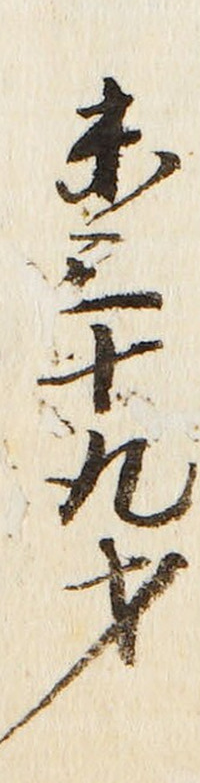未三十九才
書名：難船一件記録
